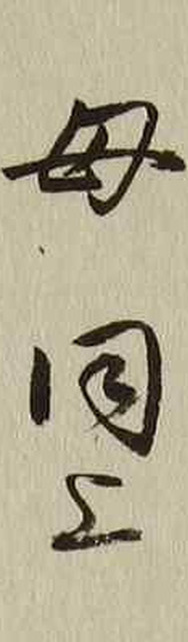母同上
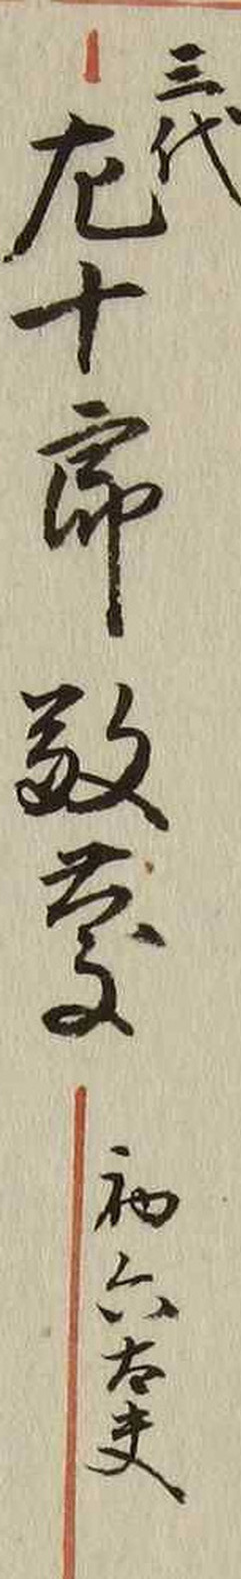左十郎敬慶初六太夫
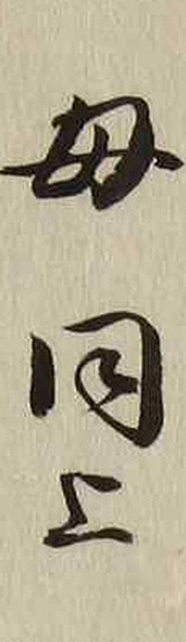母同上
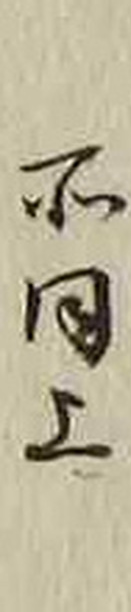所同上
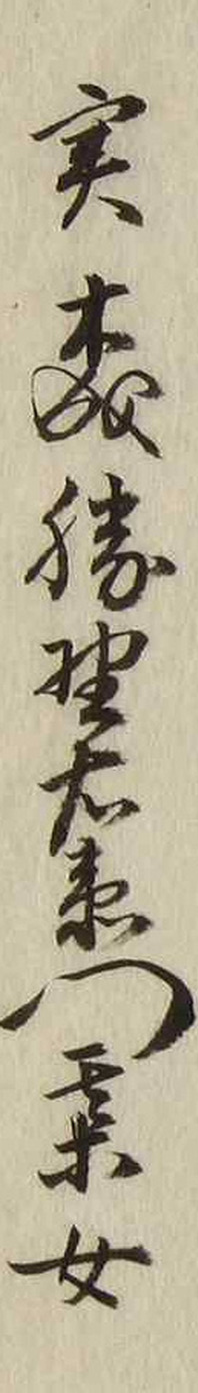実森勝野右衛門某女

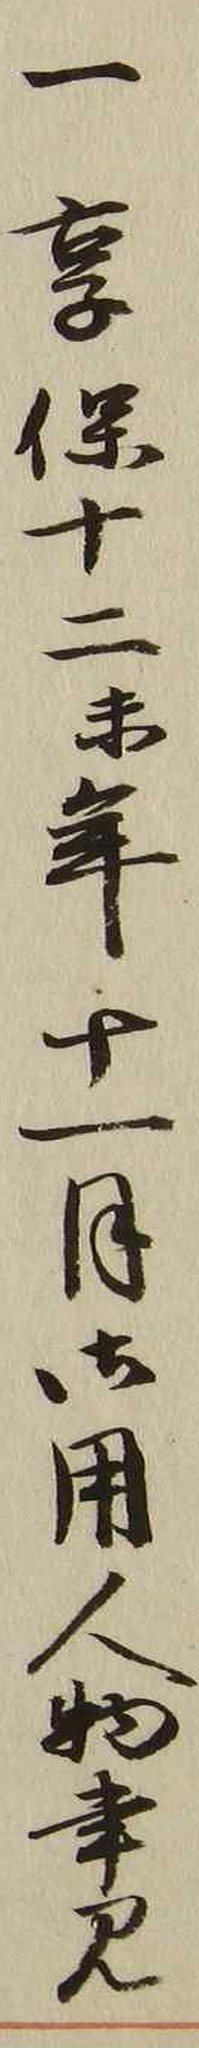一享保十二未年十一月御用人物書見
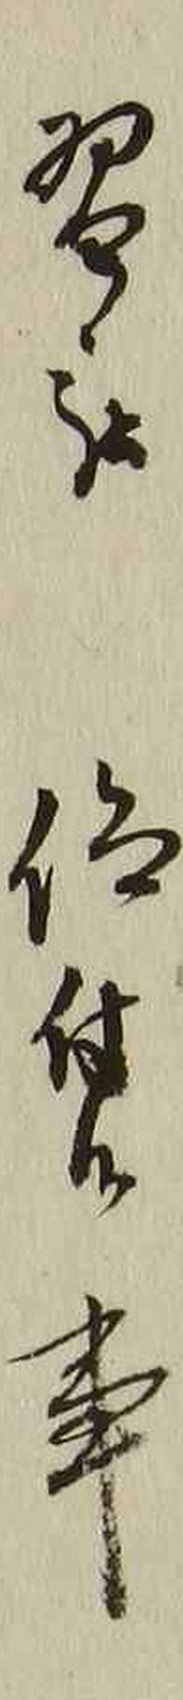習被仰付候事
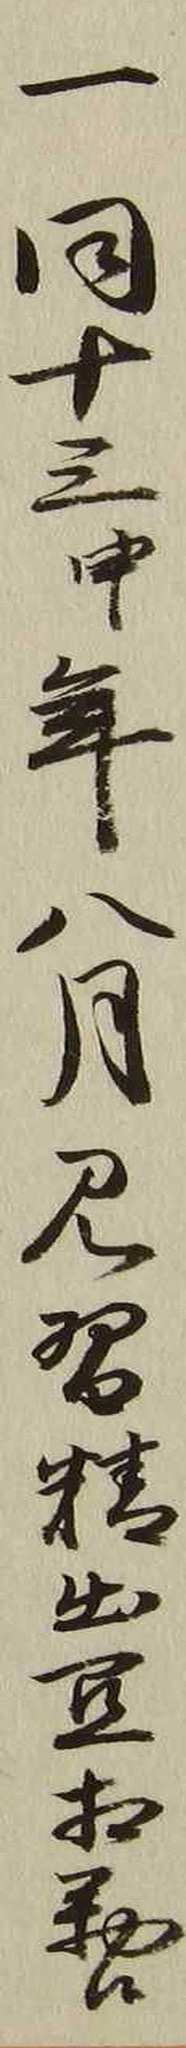一同十三申年八月見習精出宜相勤候
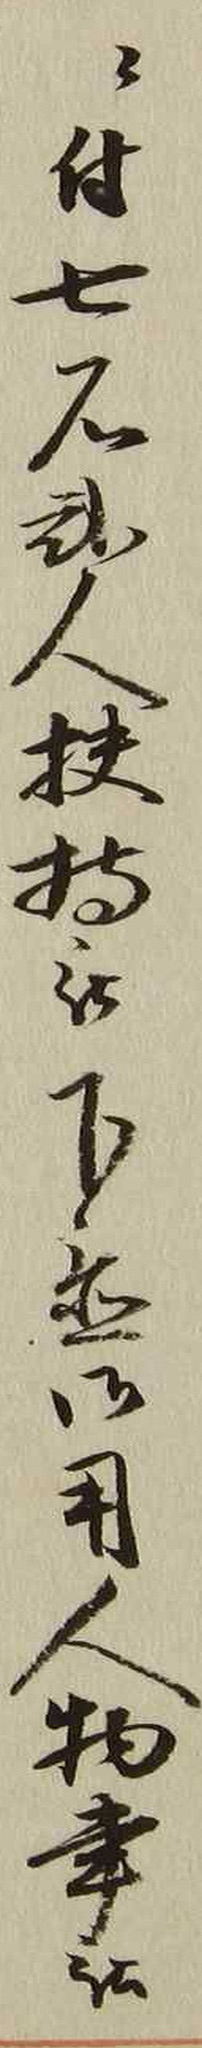ニ付七石弐人扶持被下置御用人物書被
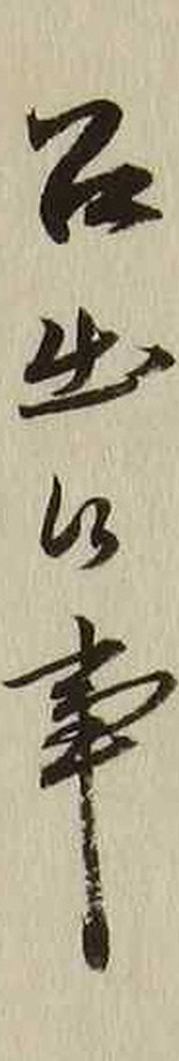召出候事
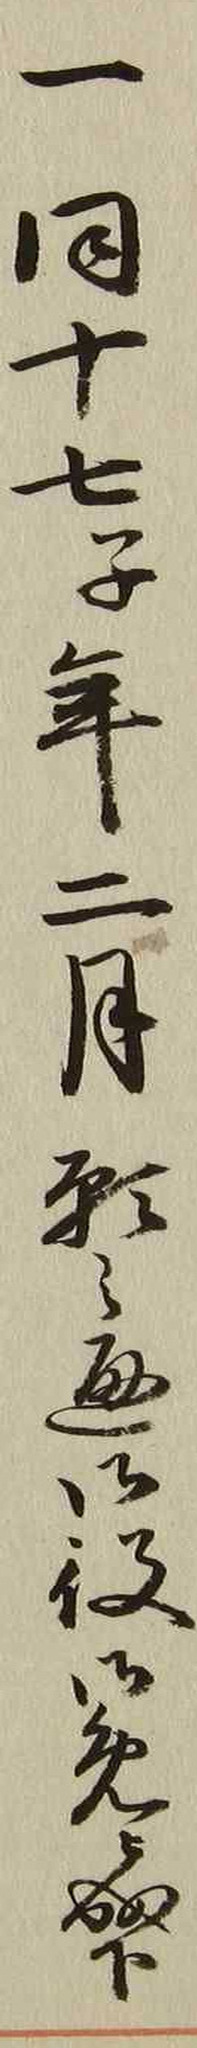一同十七子年二月願之通御役御免被成下
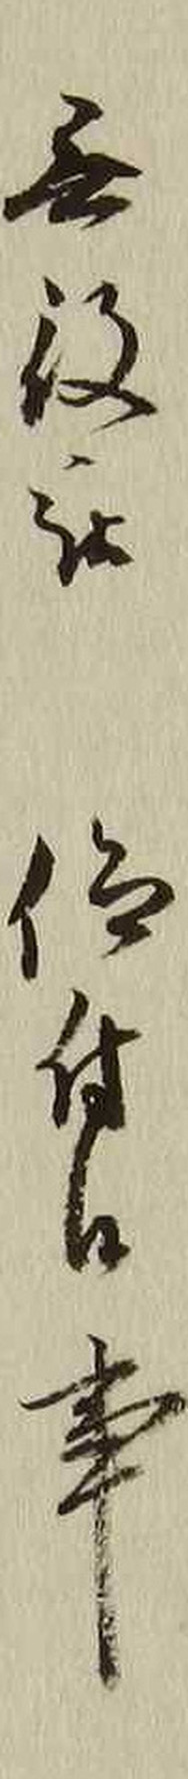無役被仰付候事
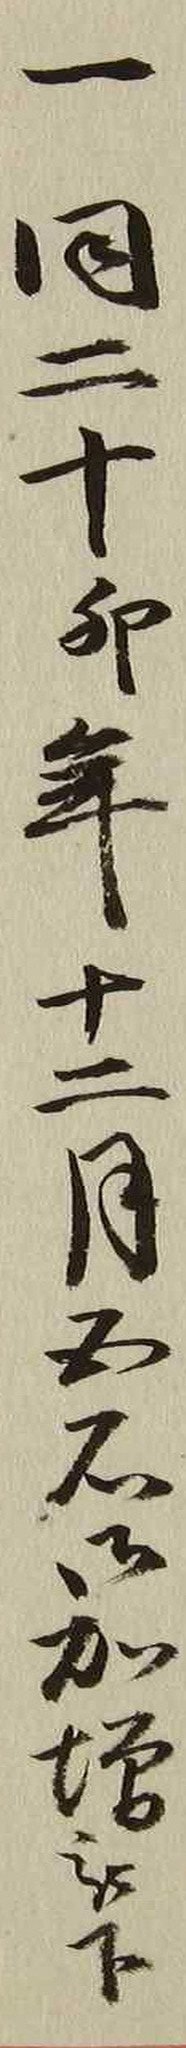一同二十卯年十二月五石御加増被下
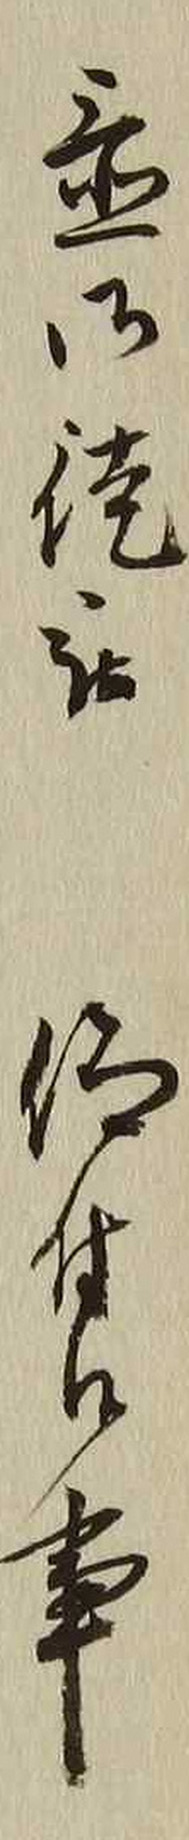置御徒被仰付候事
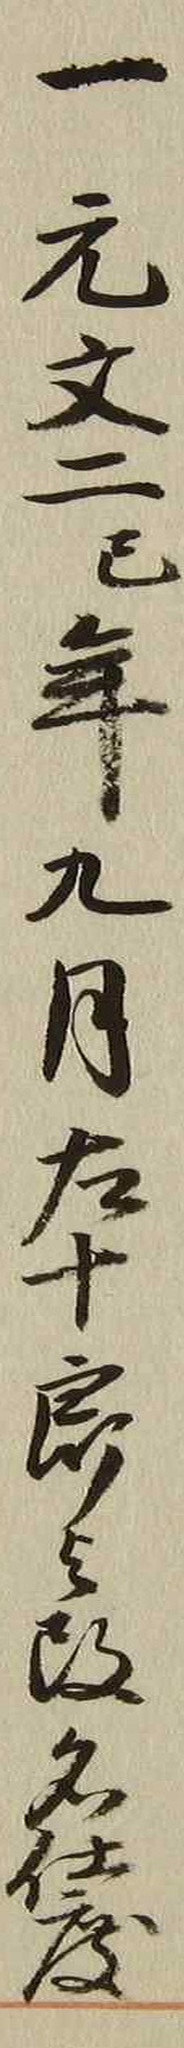一元文二巳年九月佐十郎与改名仕度
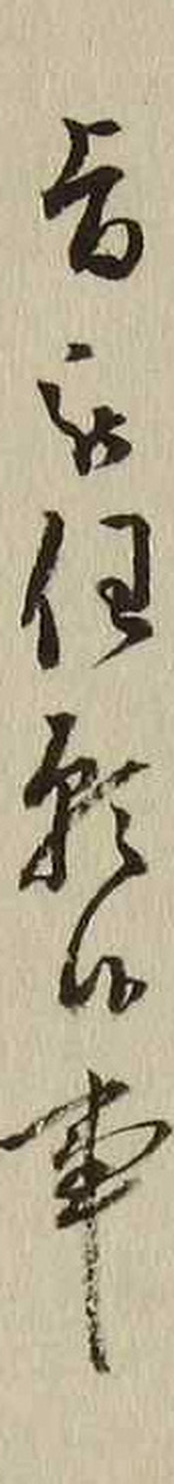旨被任願候事
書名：諸士系譜　巻之61　と之部4
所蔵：会津若松市立会津図書館
